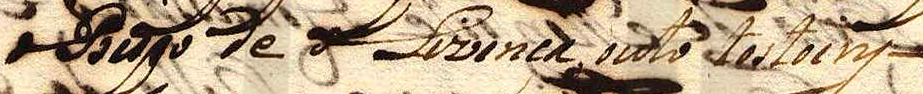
o Bispo de oLivença, outo tostoins
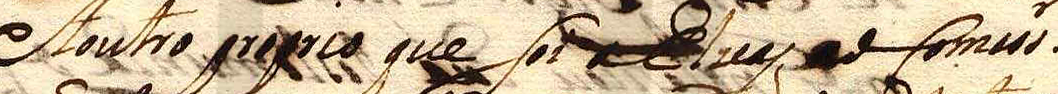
A outro proprio que foi a Elvas ao Comiss.rr
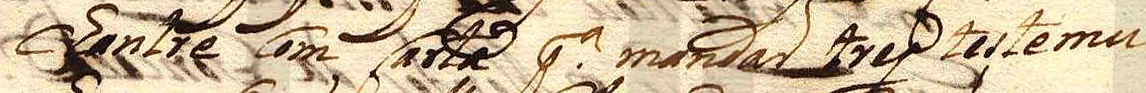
chantre com Carta p.a mandar tres testemu
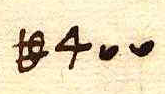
$400
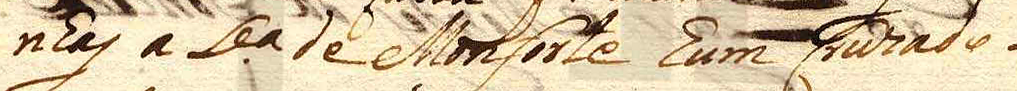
nhas a V.a de Monforte hum Cruzado
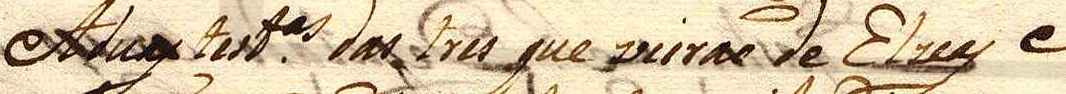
A duas test.as das tres que vieraõ de Elvas e
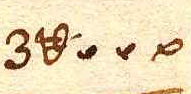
3$000
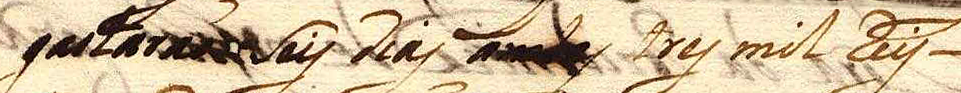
gastarão seis dias ambas tres mil Reis
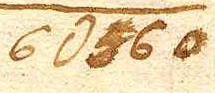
6$560
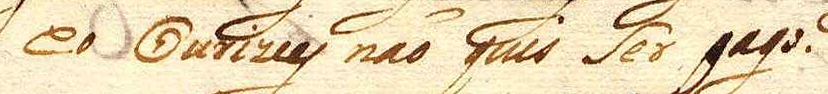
e o Ourives naõ quis ser pago.
